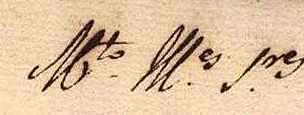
M.to Ill.es S.res
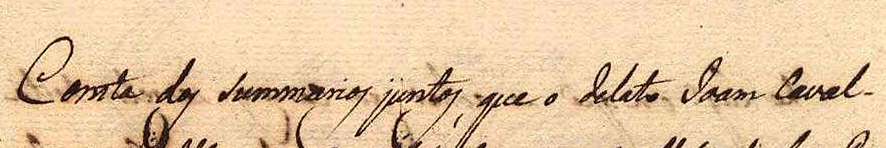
Consta dos summarios juntos, que o delato Ioam Caval
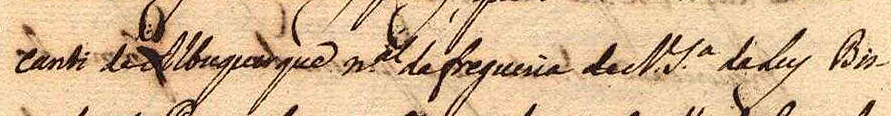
canti de Albuquerque n.al da freguezia de N. S.a da Lus Bis
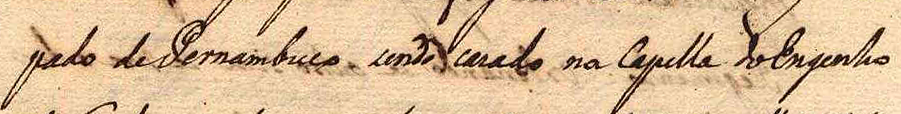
pado de Pernambuco sendo cazado na Capella do Engenho
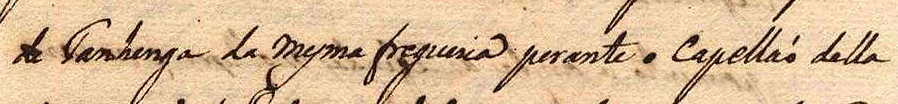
de Tanhenga da mesma freguezia perante o Capellaõ della
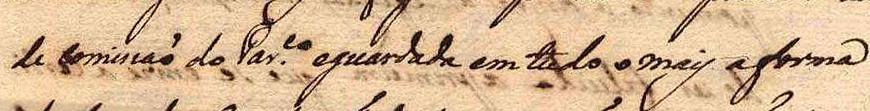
de comissaõ do Par.co e guardada em tudo o mais a forma
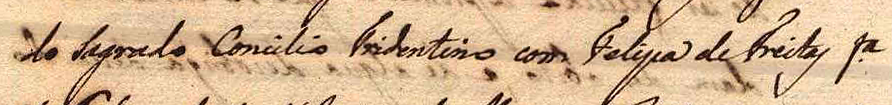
do Sagrado Concilio Tridentino com Felipa de Freitas f.a
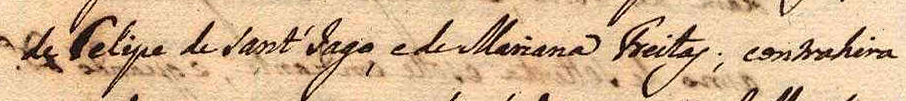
de Felipe de Sant'Iago, e de Mariana Freitas; contrahira
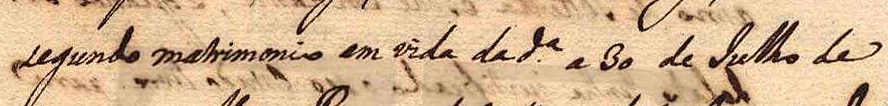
segundo matrimonio em vida da d.a a 30 de Iulho de
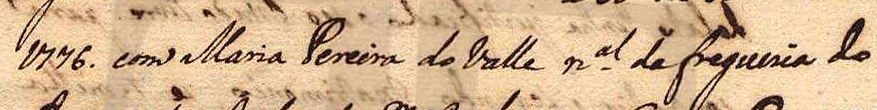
1776. com Maria Pereira do Valle n.al da freguezia do
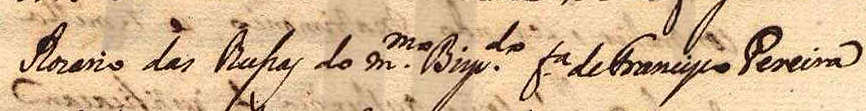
Rozario das Rusas do m.mo Bisp.do f.a de Francisco Pereira
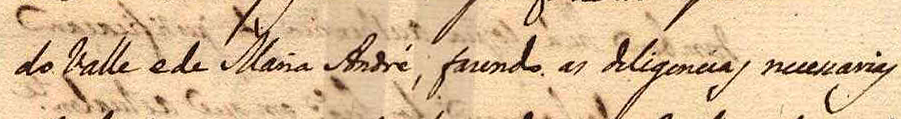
do Valle e de Maria André, fazendo as diligencias necessarias
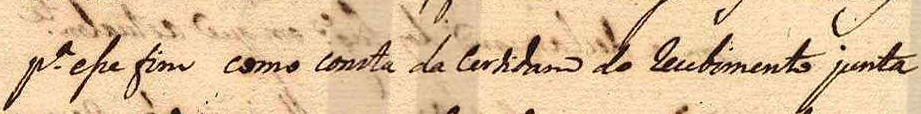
p.a esse fim como consta da certidam do Recebimento junta
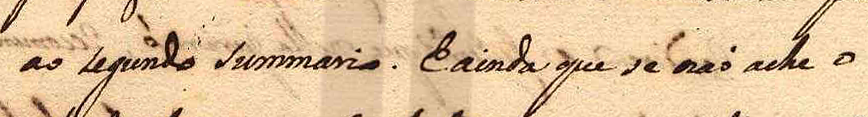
ao segundo summario. E ainda que se naõ ache o
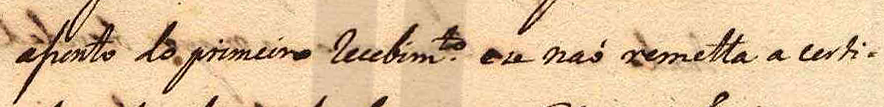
assento do primeiro Recebim.to e se naõ remetta a certi
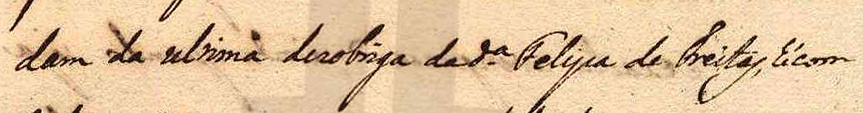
dam da ultima desobriga da d.a Felipa de Freitas, hé com
